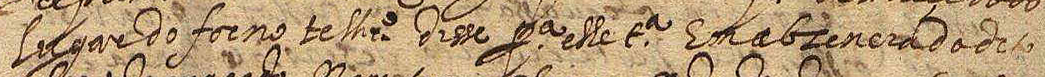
Lugar do forno telhr.o disse ꝑ.a elle t.a Em abzencia do dito
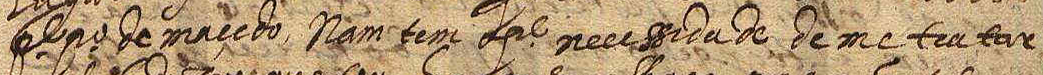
p.e p.o de macedo, nam tem o p.e necessidade de me tratar
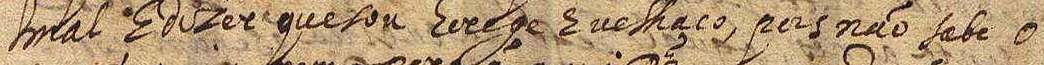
mal E dizer que sou herege E uelhaco, pois naõ sabe o
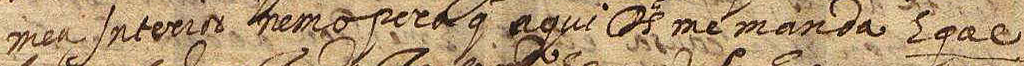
meu Jnterior nem o pera q̄ aqui Ds̄ me manda E que
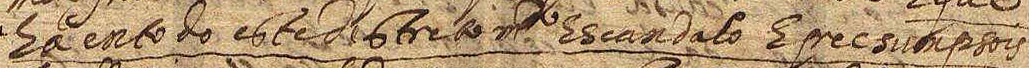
ha en todo este destrito mto Escandalo E precsumpsois
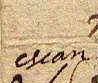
escan
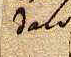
dalo
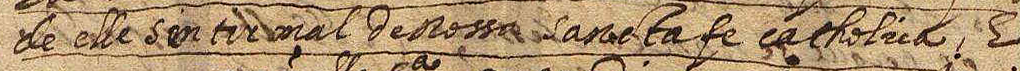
de elle sentir mal de nossa sancta fe catholica, E
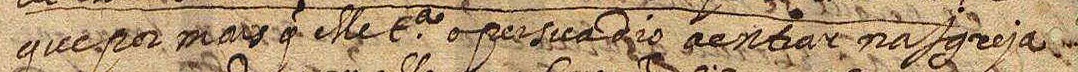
que por mais q̄ elle t.a o persuadio a entrar na Jgreja
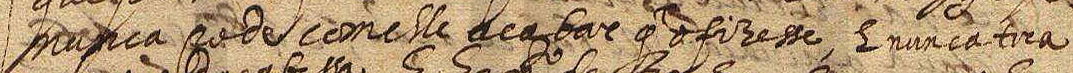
nunca pode com elle acabar q̄ o fizesse, E nunca tira
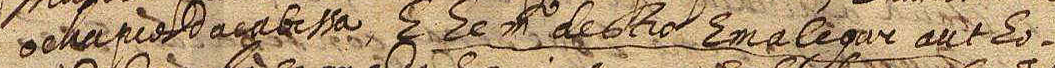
o chapeo da cabessa, E he mto destro Em alegar autho
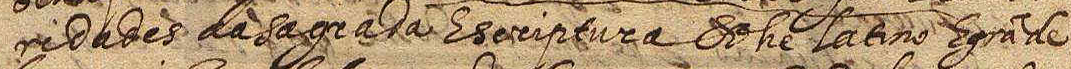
ridades da sagrada Escriptura & he latino E grāde
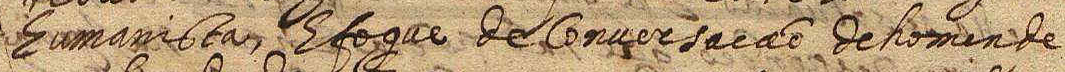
humanista, E fogue de Conuersaçaõ de homem de
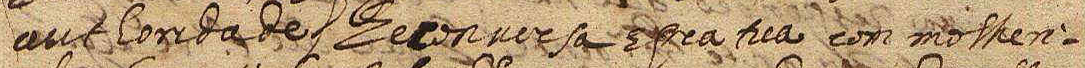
authoridade, he conuersa E pratica com molheri
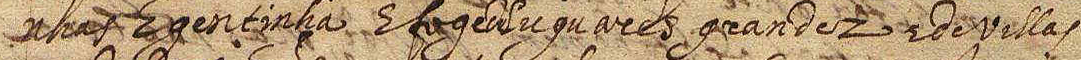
nhas E gentinha E foge de luguares grandez E de villas
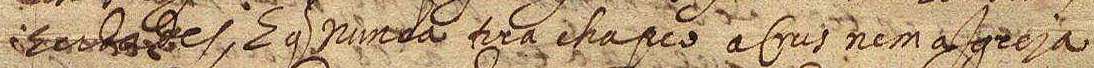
E cidades, E q̄ nunca tira chapeo a Crus nem a Jgreja
